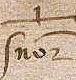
Snor̄
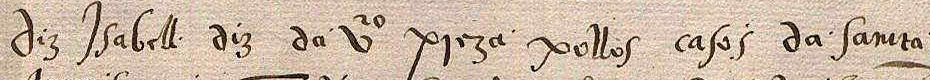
diz Jsabell diz davro preza pollos casos da Samta
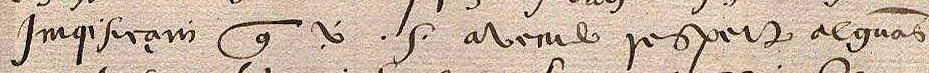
Jmqisiçam q̄ .v. .s. avemdo respeito algūas
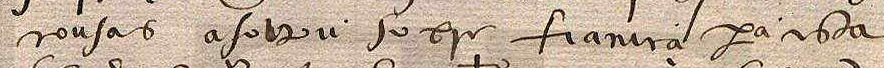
cousas a soltou sobre fiança ꝑa esta
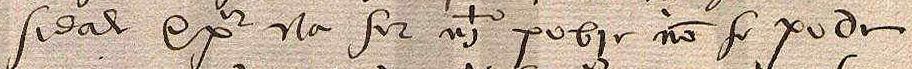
sidade e por ella ser mto pobre n̄o se pode
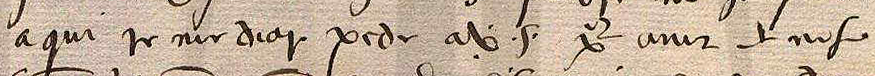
aqui remediar pede a V. s. por amor de noso
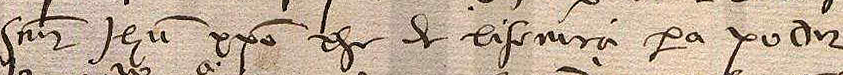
snōr Jhū xp̄o lhe de lisemça ꝑa poder
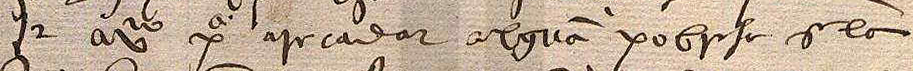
Jr avro pa arecadar alguā pobresa se la
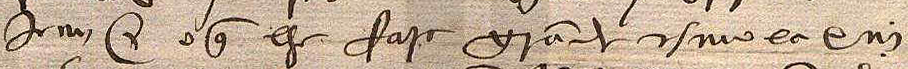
tem ē o q̄ lhe fara grāde esmola e .m.
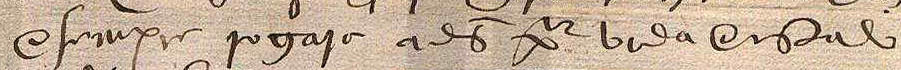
e sempre rogara a ds̄ por vida e estado
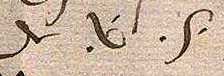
de .V .s.
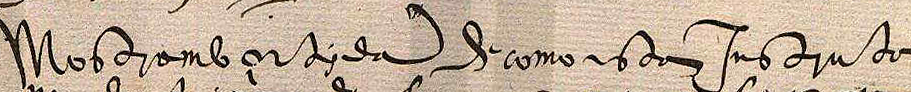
Mostramdo certydā de como esta Jnstruta
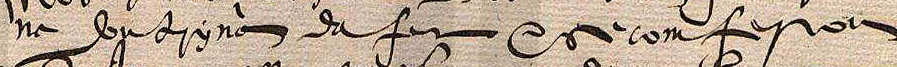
na doutryna da fee e se comfesou
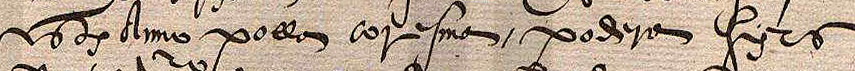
este Anno polla coresma, podera hyrse
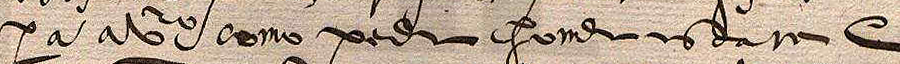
ꝑa avro como pede homde estara e
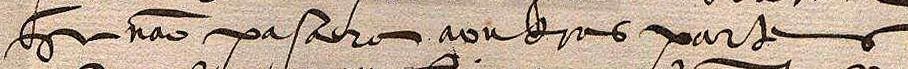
se não pasara a outras partes
